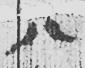八
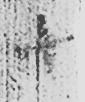七
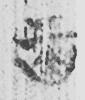百
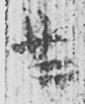廿=
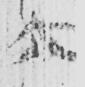六
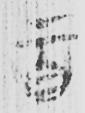百
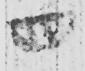四
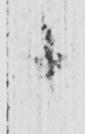十
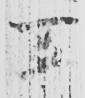五
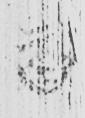百
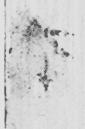{六十}
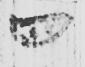四
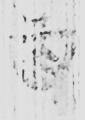百
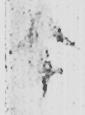{八十}
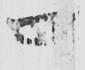四
